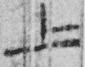上
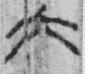六
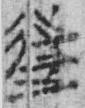○（往）
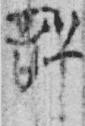訐
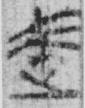○（來）
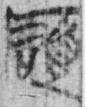碩
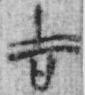吉
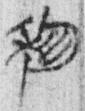利
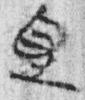見
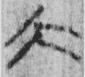大
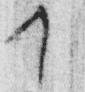人
